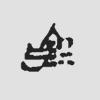爲
